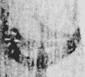曰
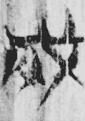城（成）
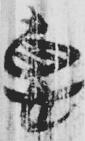惪（德）
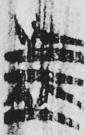者
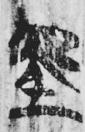○（吾）
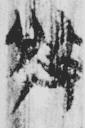敓
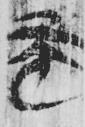而
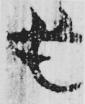弋（代）
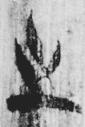之
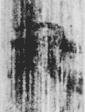亓（其）
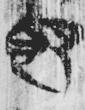即（次）
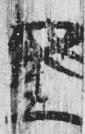○（吾）
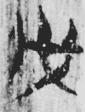伐
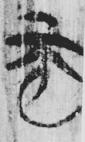而
